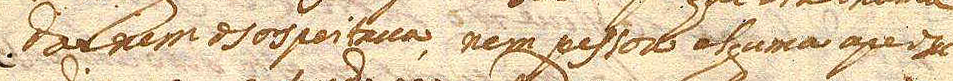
da nem o sospeitaua nem pessoa alguma a persu
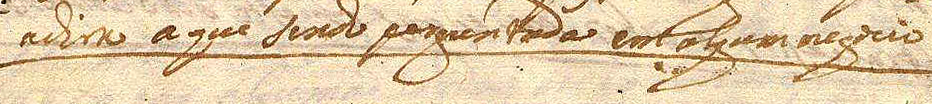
adira a que sendo perguntada em algum negocio
